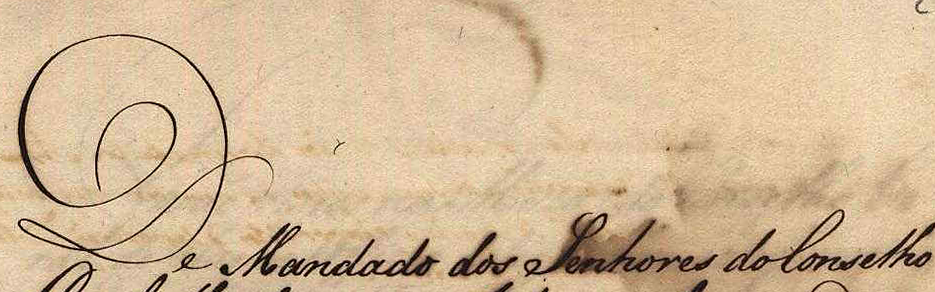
De Mandado dos Senhores do Conselho
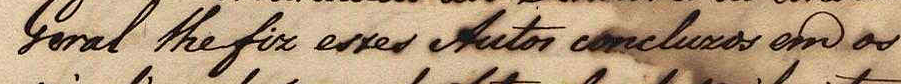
Geral lhe fiz estes Autos concluzos em os
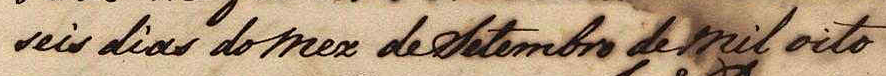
seis dias do mez de Setembro de mil oito
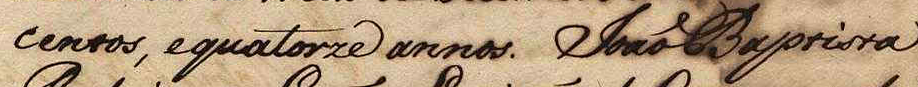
centos, e quatorze annos. Ioaõ Baptista
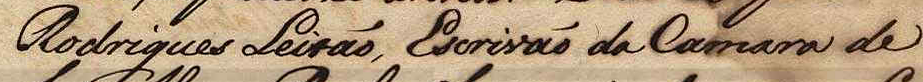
Rodrigues Leitaõ, Escrivaõ da Camara de
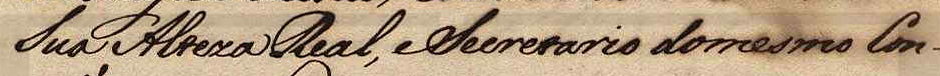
Sua Alteza Real, e Secretario do mesmo Con
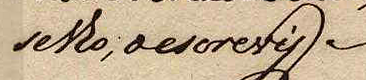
selho, o escrevy
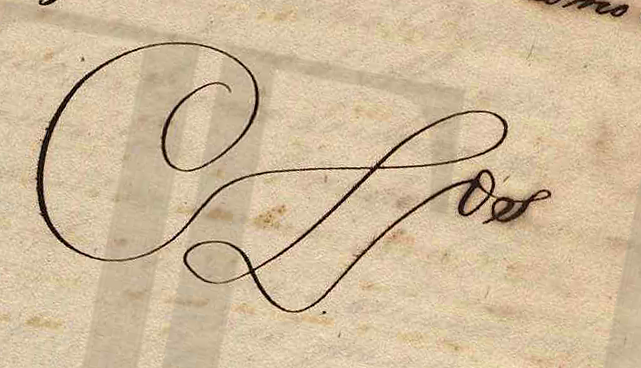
CL.os
